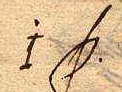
i p.
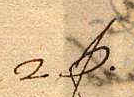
2. p.
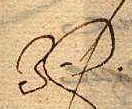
3. p.
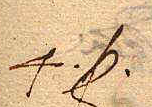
4. p.
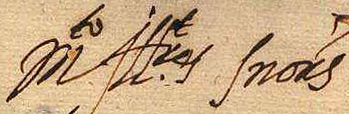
Mto Jl̄l.tres Snor̄s
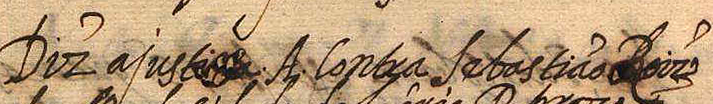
Diz̄ a justica .A. Contra Sebastião Roiz̄
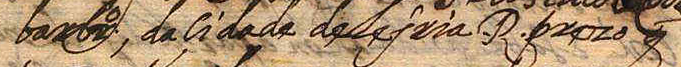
barbro, da çidade de Lejria .R. prezo q̄
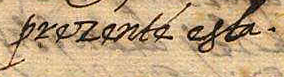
prezente esta.
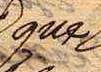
que
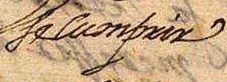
se cumprir
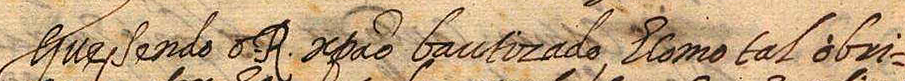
Que sendo o .R. xpaõ bautizado, E como tal obri
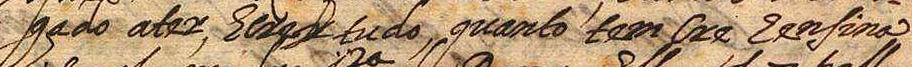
gado a ter, E crer tudo, quanto tem cre E ensina
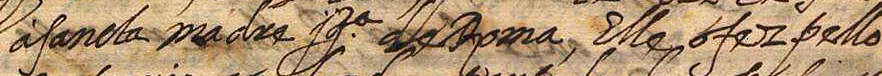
á sancta madre jg.ra de Roma, Elle o fez pello
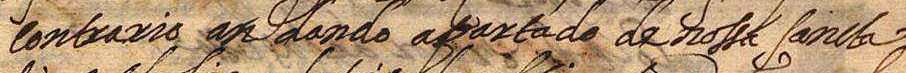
contrario andando apartado de nossa sancta
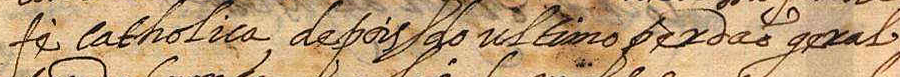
fé catholica, depois do ultimo perdaõ geraL
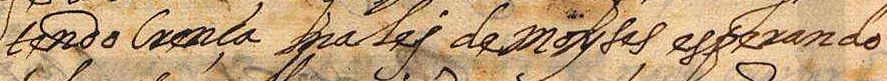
tendo crença na Lej de moyses esperando
